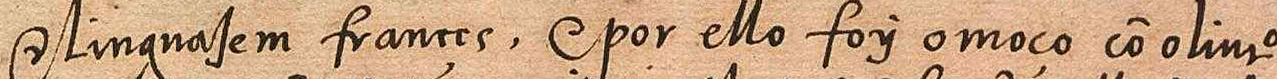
e̅ Linguajem françes, e por ello foy o moço co̅ o liuro
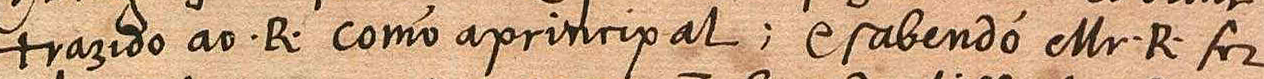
trazido ao .R. como a principaL; e sabendo elle .R. ser
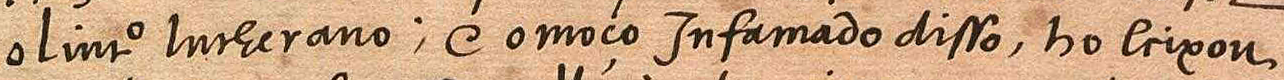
o liuro lutherano; e o moço Jnfamado disso, ho leixou
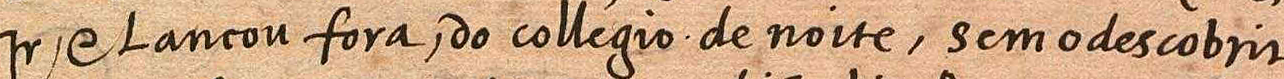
Jr, e Lancou fora, do collegio de noite, sem o descobrir
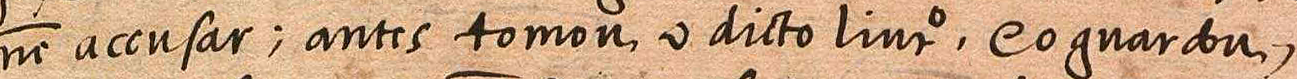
ne̅ accusar; antes tomou o dicto liuro, e o guardou,
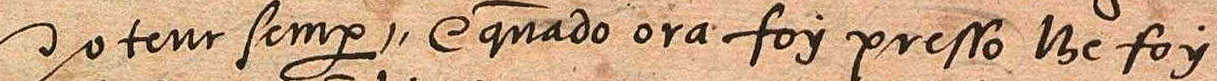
e o teue semꝑ, e q̅uado ora foy presso lhe foy
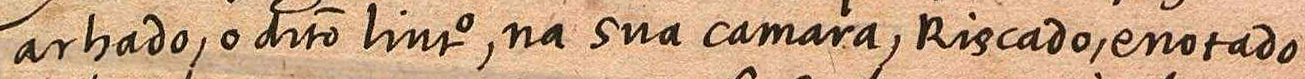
achado, o dito liuro, na sua camara, Riscado, e notado
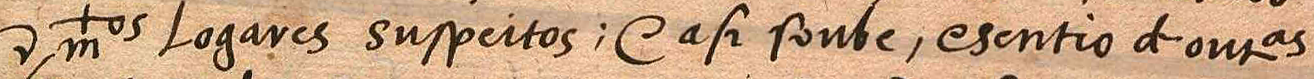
e̅ mtos Logares suspeitos; e asi soube, e sentio de outas
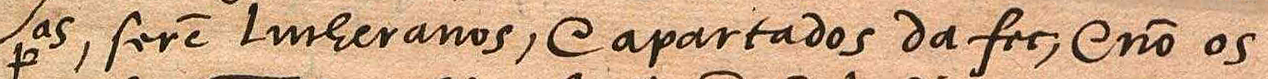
pas, sere̅ Lutheranos, e apartados da fee, e no̅ os
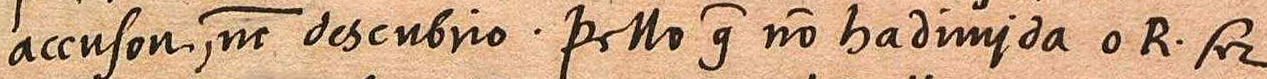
accusou, n̅e descubrio. pello q̅ no̅ ha duujda o R. ser
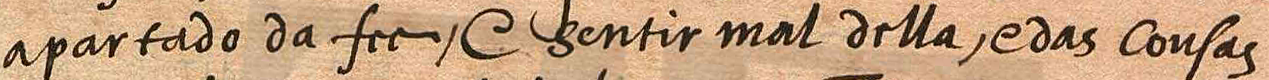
apartado da fee, e sentir mal della, e das cousas
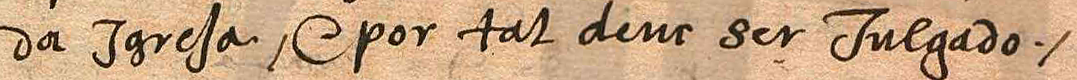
da Jgreja, e por tal deue ser Julgado./
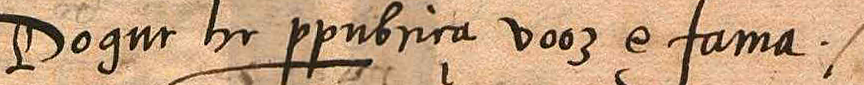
Do que he ppubriça vooz e fama./
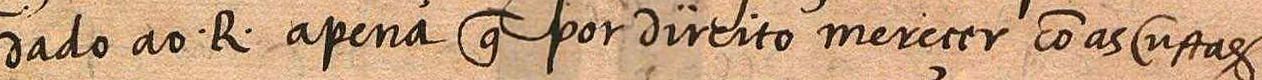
dado ao .R. a pena q̅ por direito mereçer c̅o as Custas
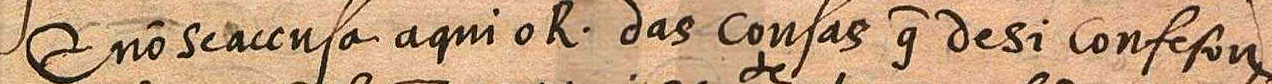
E no̅ se accusa aqui o R. das cousas q̅ de si confesou,
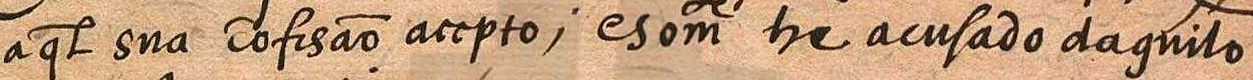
a q̅L sua c̅ofisão acepto; e somte he acusado daquilo
